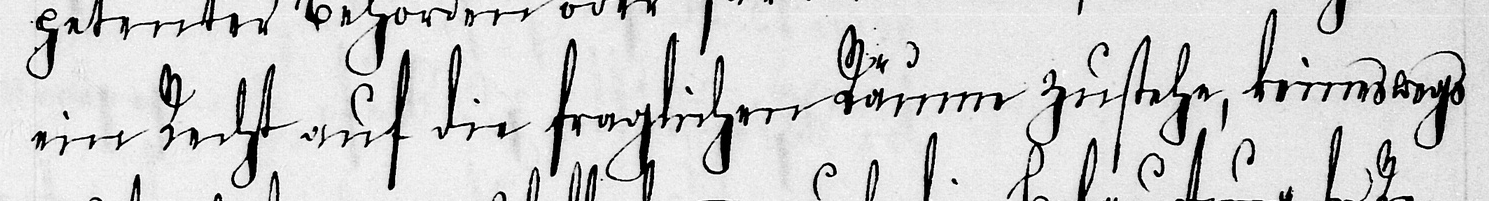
ein Recht auf die fraglichen Räume zustehe, keineswegs
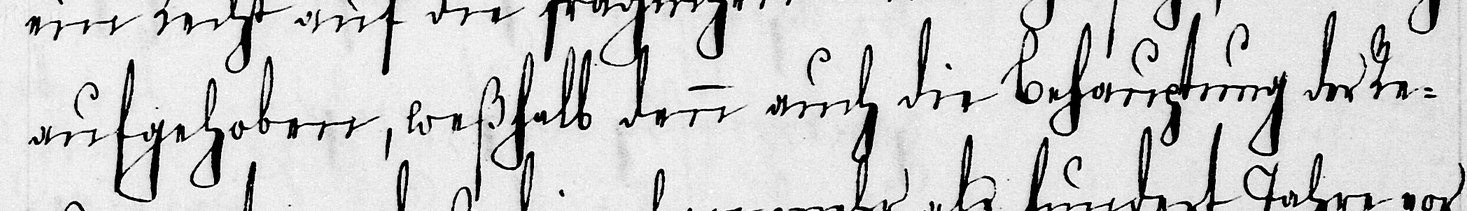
aufgehoben, weßhalb denn auch die Behauptung der Re¬
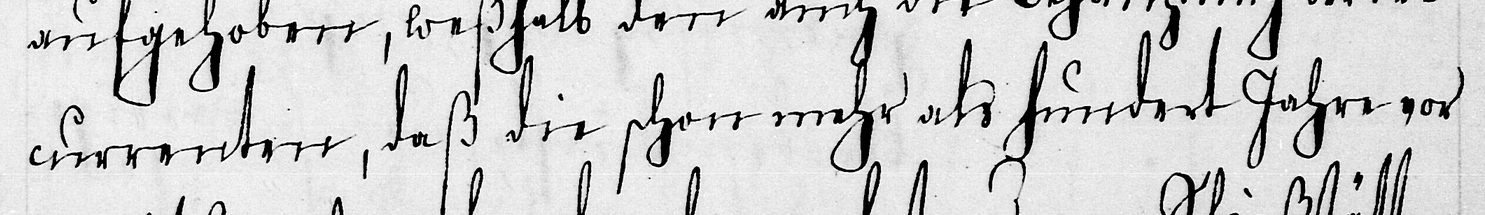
currenten, daß die schon mehr als hundert Jahre vor
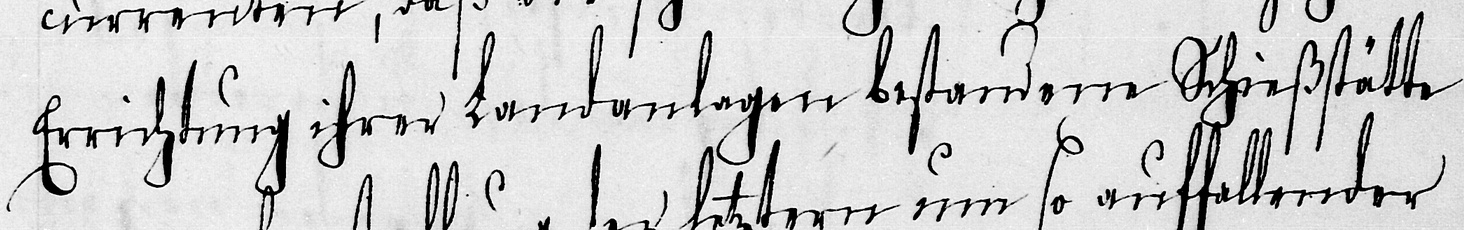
Errichtung ihrer Landanlagen bestandene Schießstätte
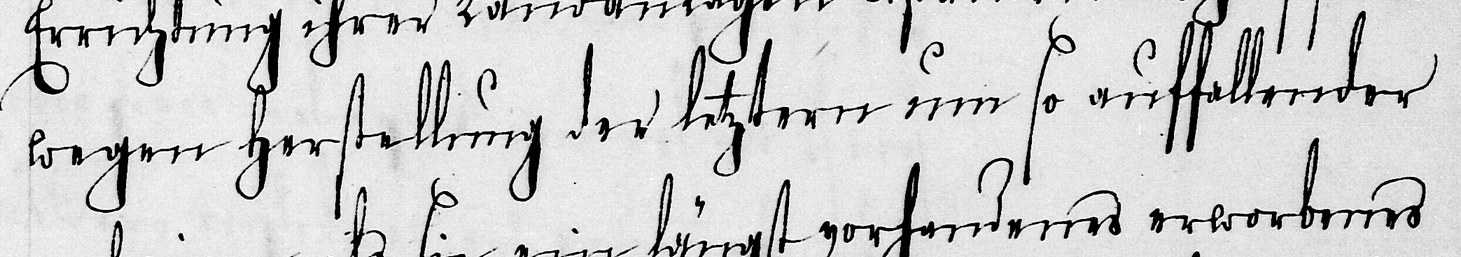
wegen Herstellung der letztern um so auffallender
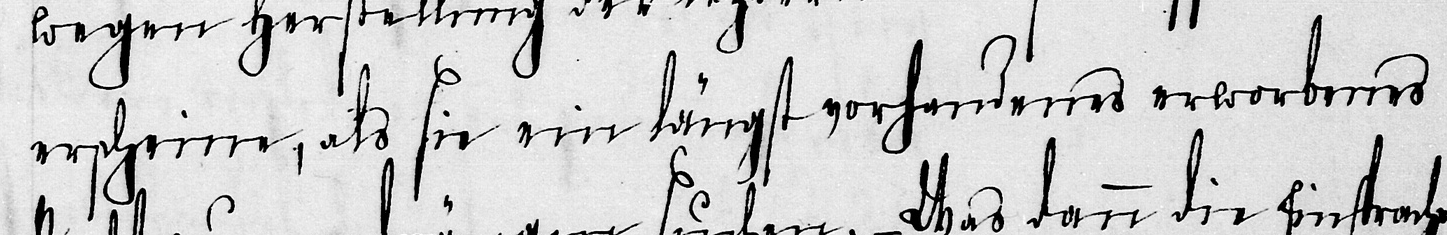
erscheine, als sie ein längst vorhandenes erworbenes
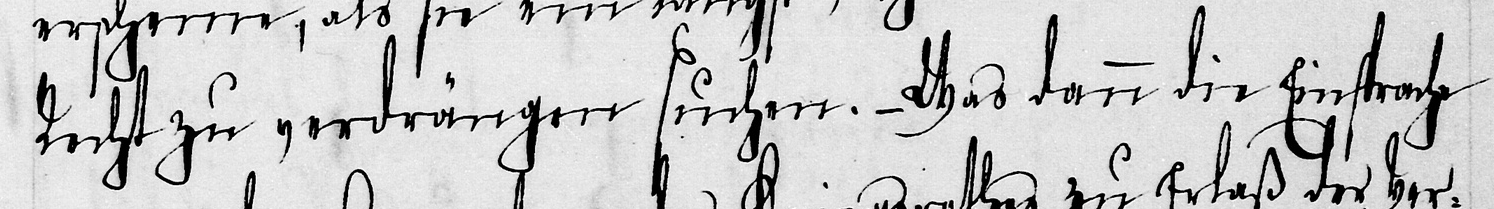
Recht zu verdrängen suchen. – Was dann die Einsprache
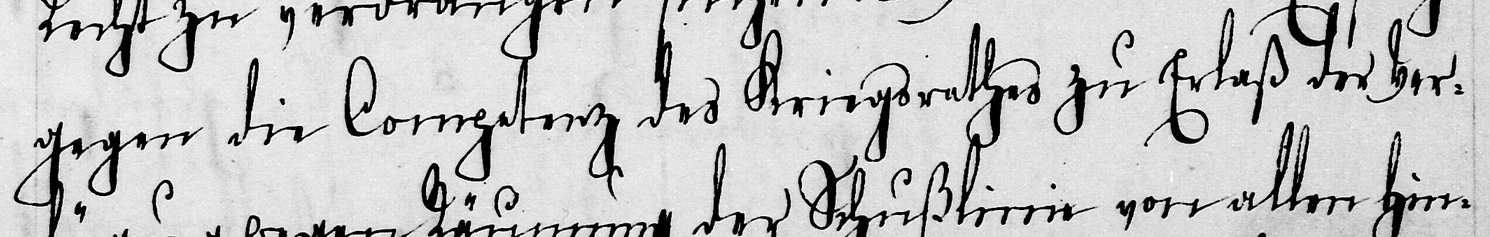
gegen die Competenz des Kriegsrathes zu Erlaß der Ver¬
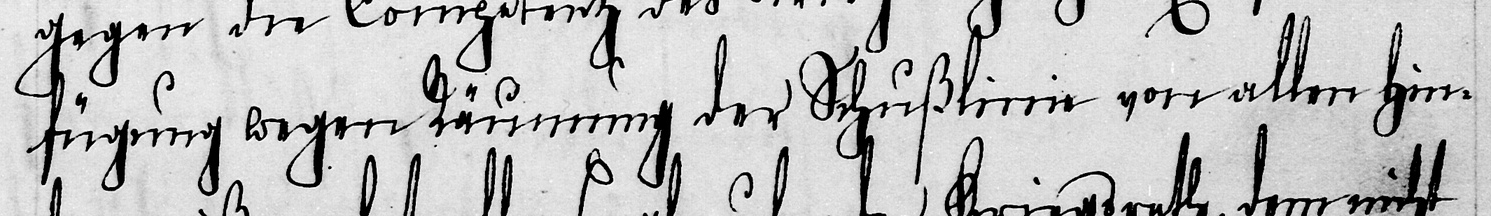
fügung wegen Räumung der Schußlinie von allen Hin¬
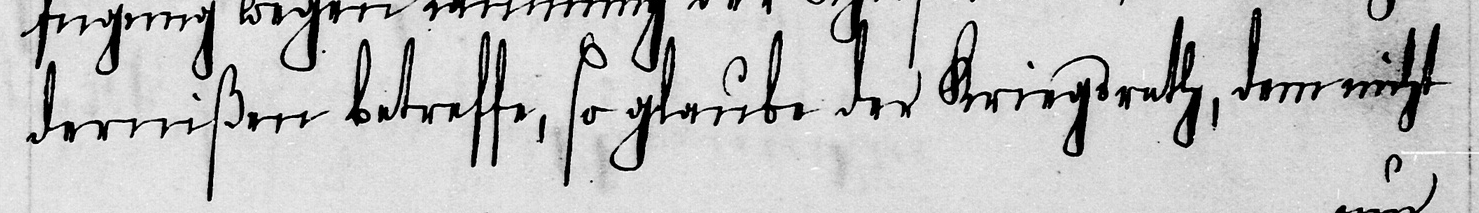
dernißen betreffe, so glaube der Kriegsrath dem nicht
